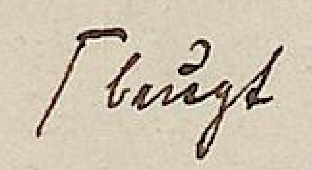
[ beugt
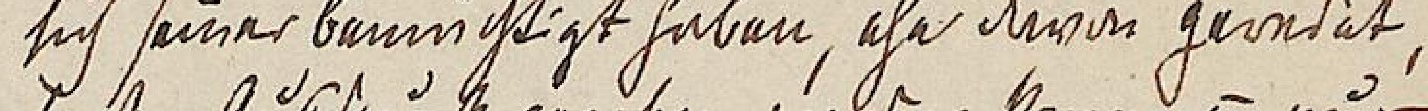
sich seiner bemächtigt haben, ehe davon geredet,
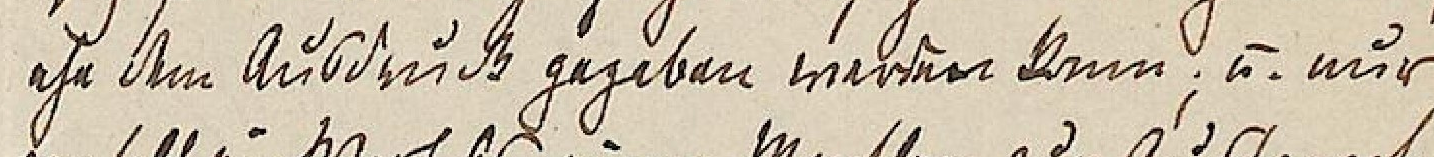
ehe dem Ausdruck gegeben werden kann; u. nur
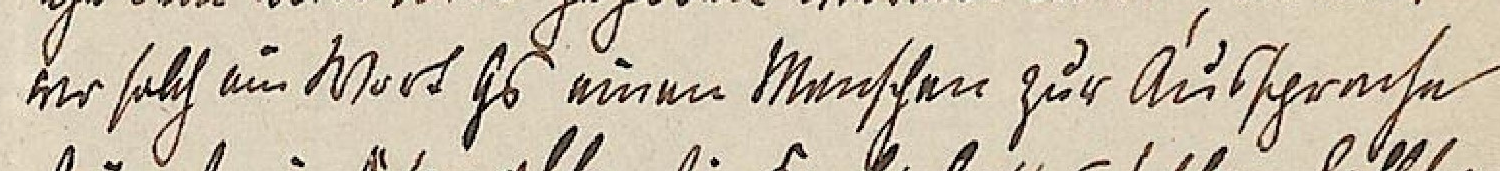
wo solch ein Wort Gs einen Menschen zur Aussprache
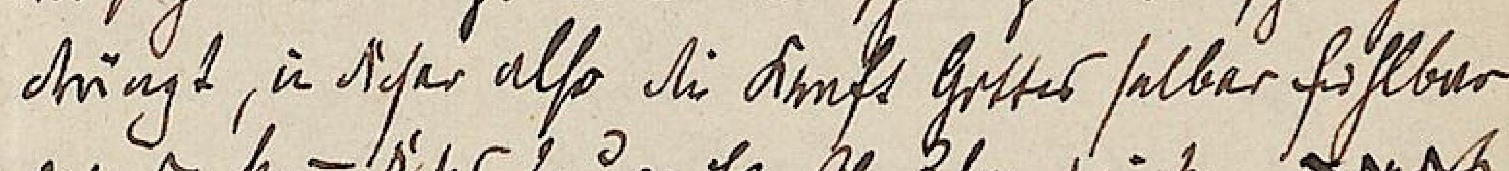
drängt, in dieser also die Kraft Gottes selber fühlbar
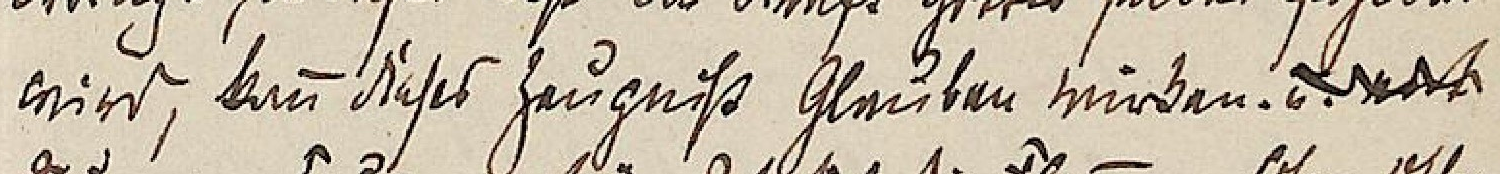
wird, kann dieses Zeugniß Glauben wirken. u. mit
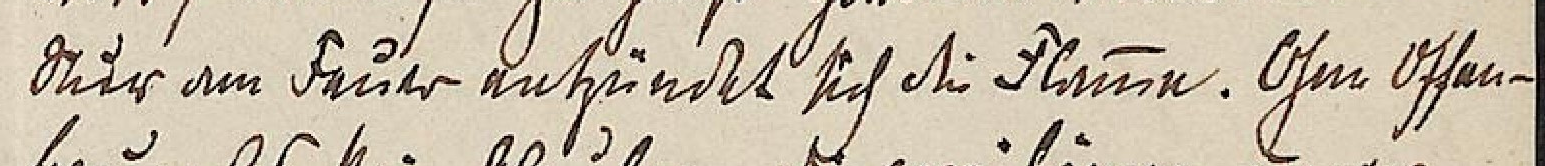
Nur am Feuer entzündet sich die Flame. Ohen Offen¬
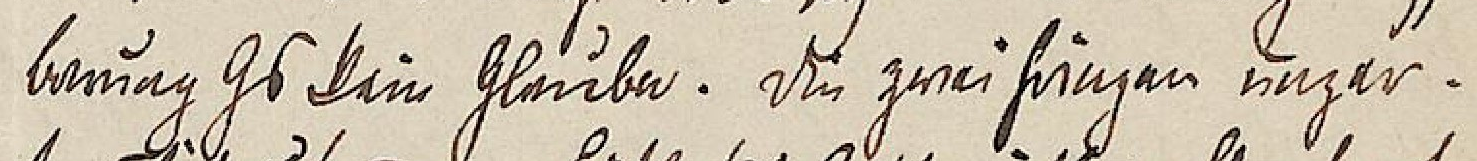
barung Gs kein Glaube. Die zwei hängen unzer¬
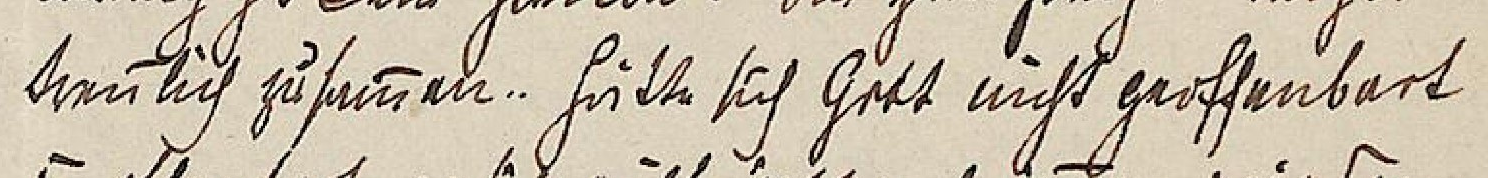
trenlich zusamen.. Hätte sich Gott nicht geoffenbart
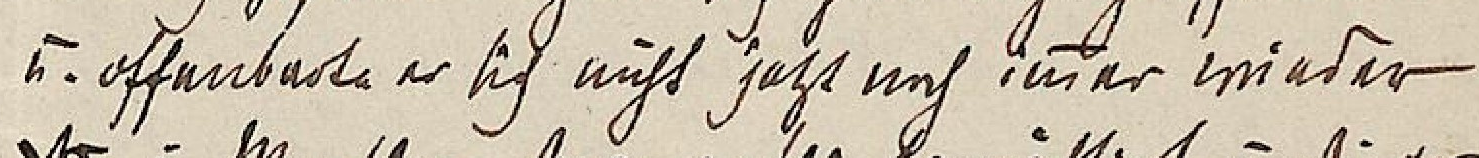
u. offenbarte er sich nicht jetzt noch immer wieder
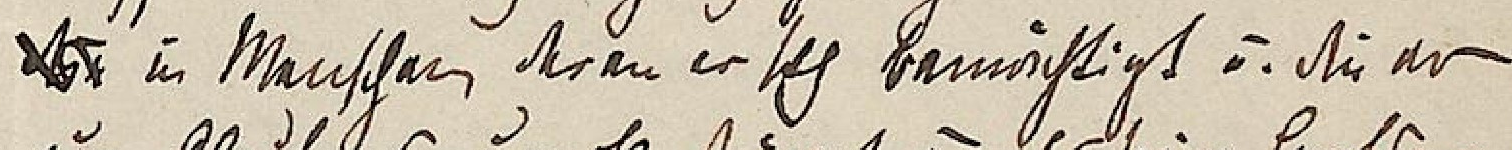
dan im Menschen, deren er sich bemächtigt u. die er
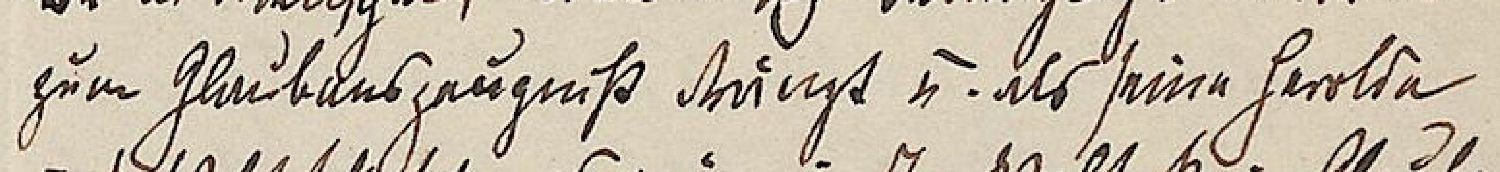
zum Glaubenszeugniß drängt u. als seine Herolde
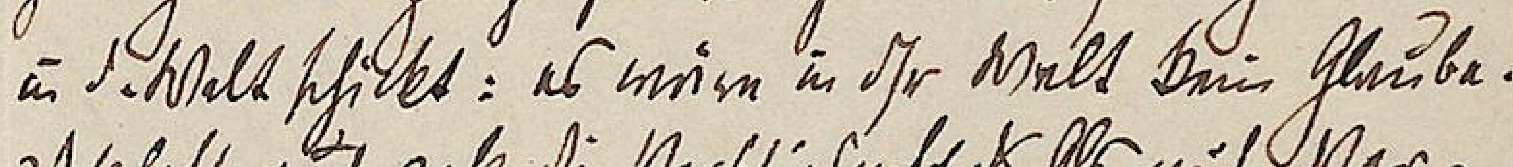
in d. Welt schickt: es wäre in dsr Welt kein Glaube.
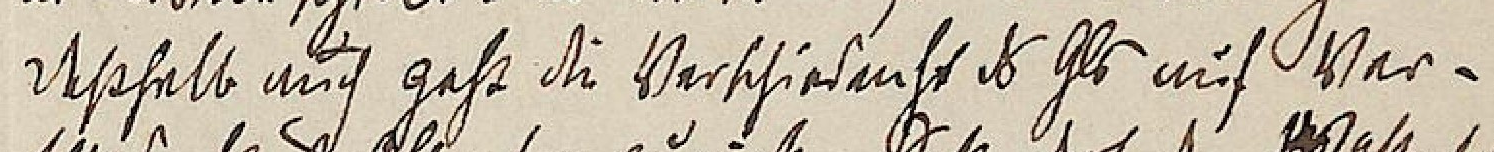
Deshalb auch geht die Verschiedenht ds. Gls. auf Ver¬
